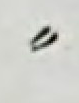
„
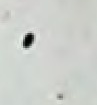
„
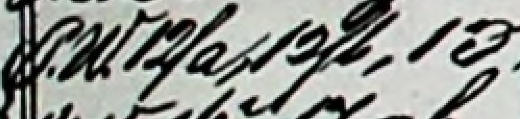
P.W. 12/a, 12/b, 13
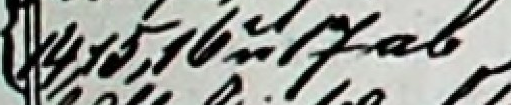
14,15,16 u 17 ab
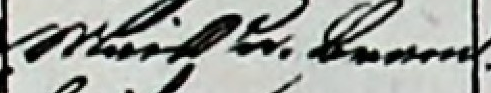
Mais u. Brand„
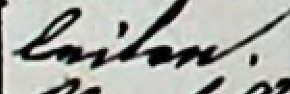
leiten
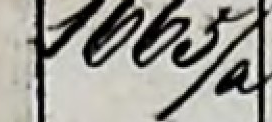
1665/a
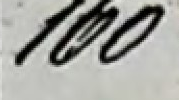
160
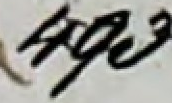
493
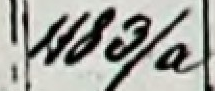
1183/a
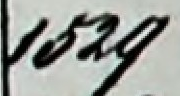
1529
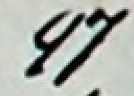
47
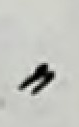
„
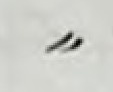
„
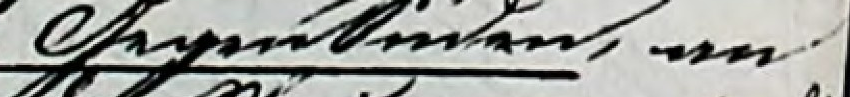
Gegen Seiden, an
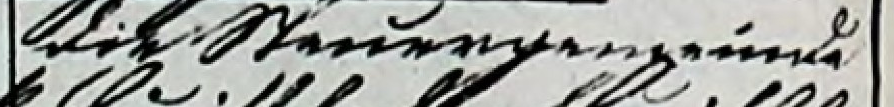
die Steuergemeinde
